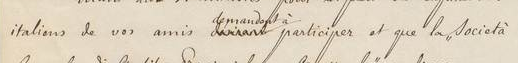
italiens de vos amis desirentdemandent à participer et que la «Società
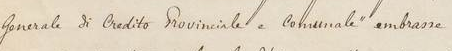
Generale di Credito Provinciale e Comunale» embrasse
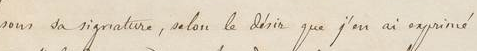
sous sa signature, selon le désir que j'en ai exprimé
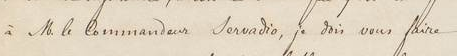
à M. le Commandeur Servadio, je dois vous faire
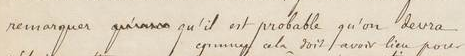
remarquer qu'on qu'il est probable qu'on devra
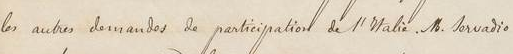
les autres demandes de participation de l'Italie. M. Servadio
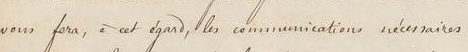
vous fera, à cet égard, les communications nécessaires
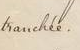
tranchée.
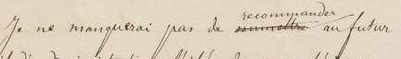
Je ne manquerai pas de soumettrerecommander au futur
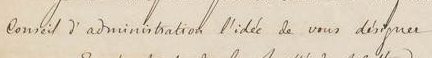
Conseil d'administration l'idée de vous désigner
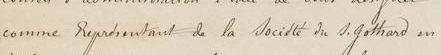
comme Représentant de la Société du S. Gothard en
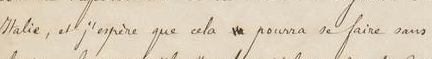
Italie, et j'espère que cela se pourra se faire sans
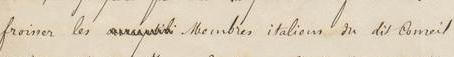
froisser les ... Membres italiens du dit Conseil
